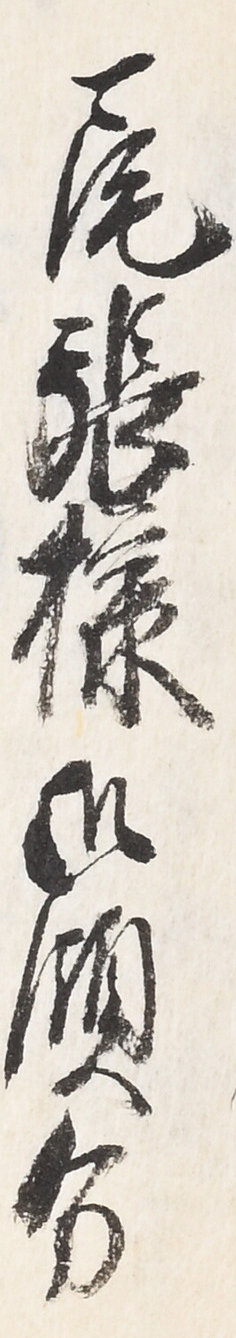尾張様御領分
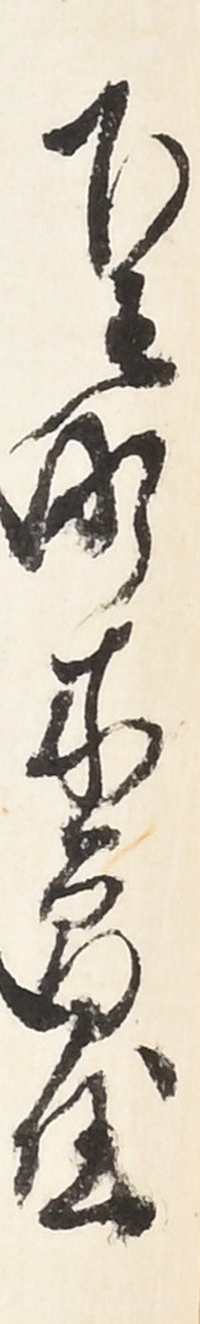下モ町木曽屋
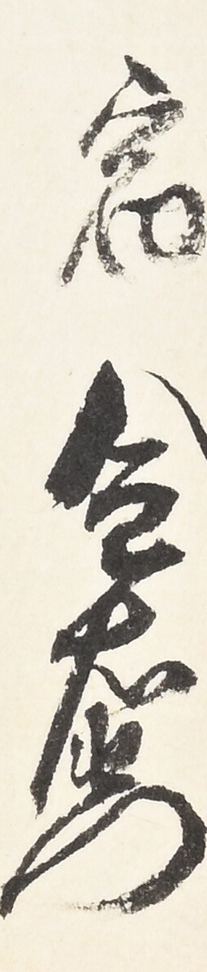宿金右衛門
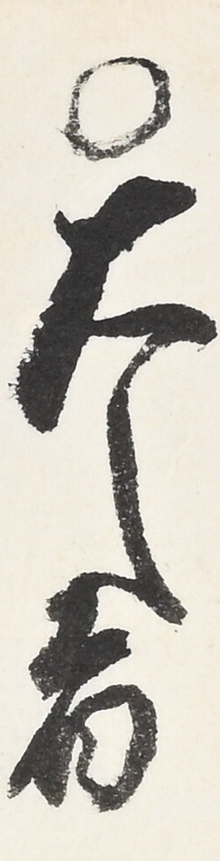〇右之者
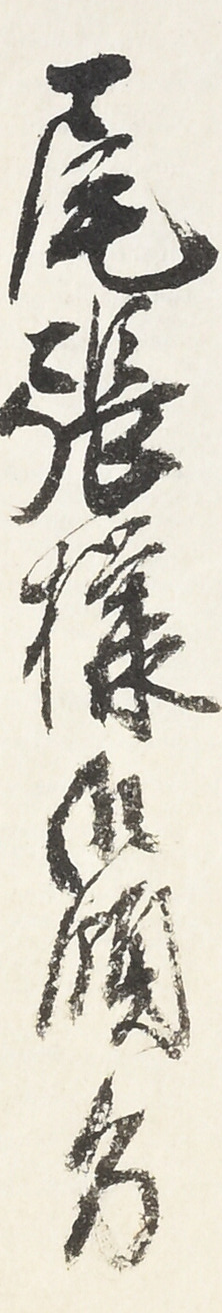尾張様御領分
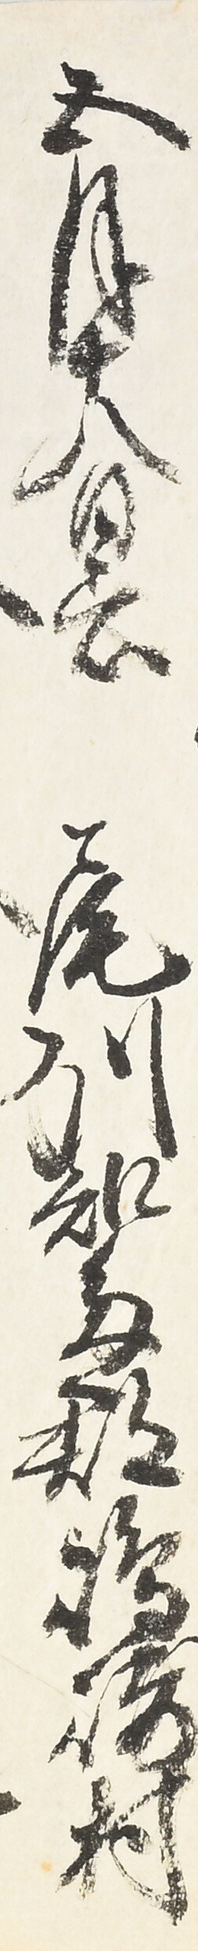五月十八日着尾州知多郡嶋崎村
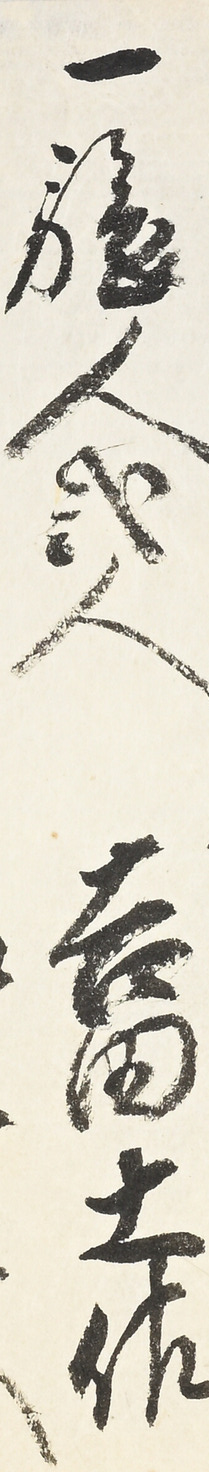一旅人弐人吉田土佐
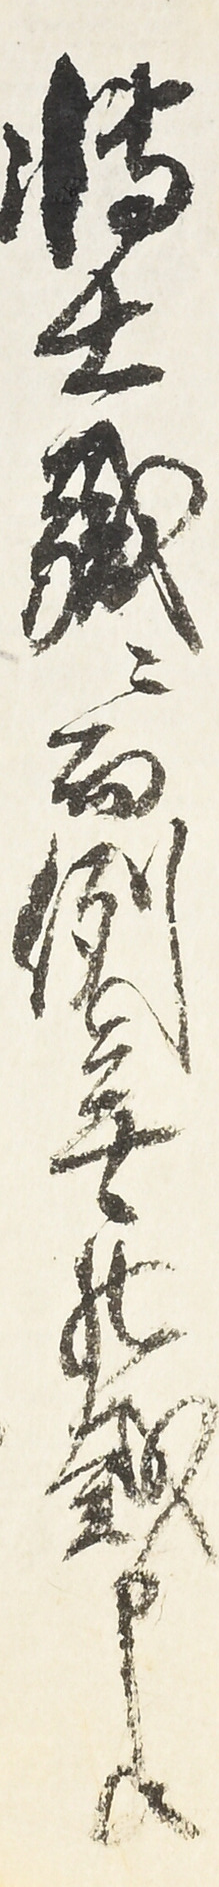転士職ニ而例年罷越申事
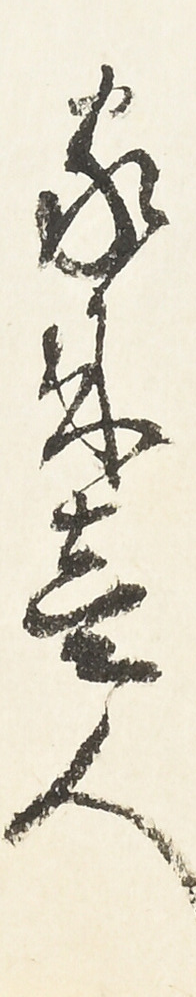家来壱人
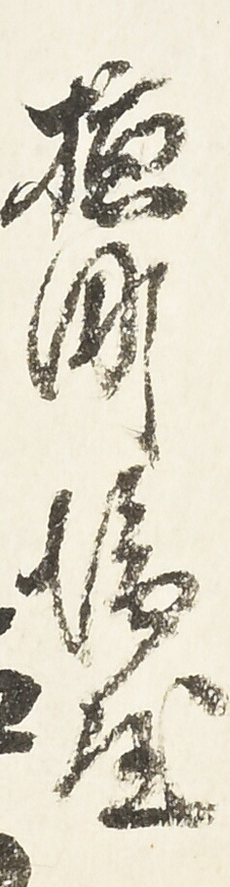横町塩屋
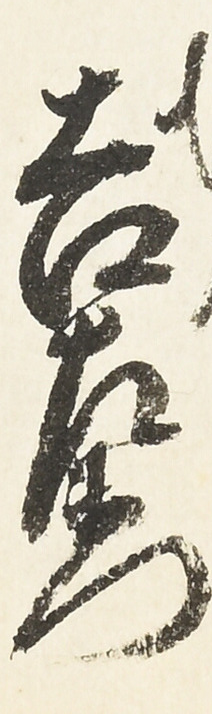吉左衛門
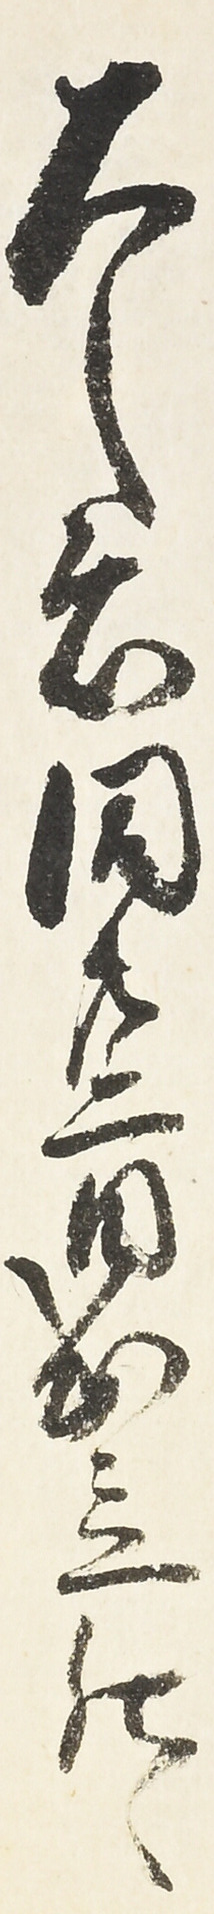右之者同十二日出立仕候
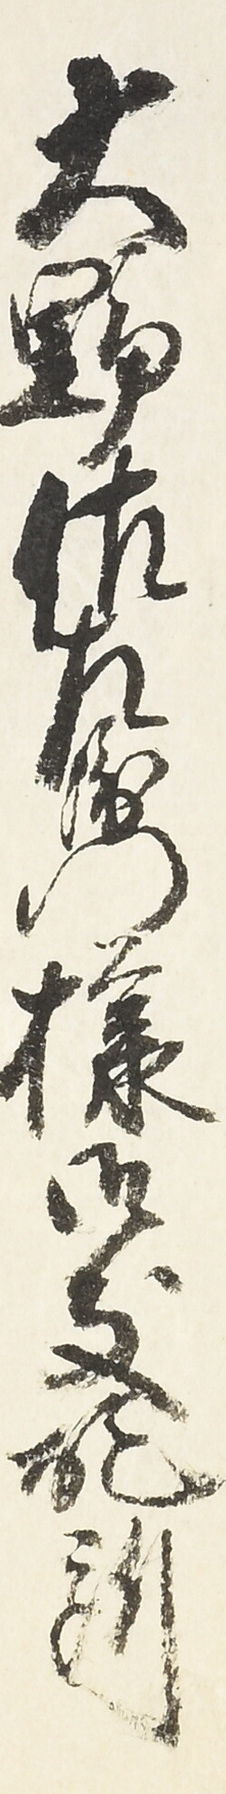大野佐左衛門様御支配所
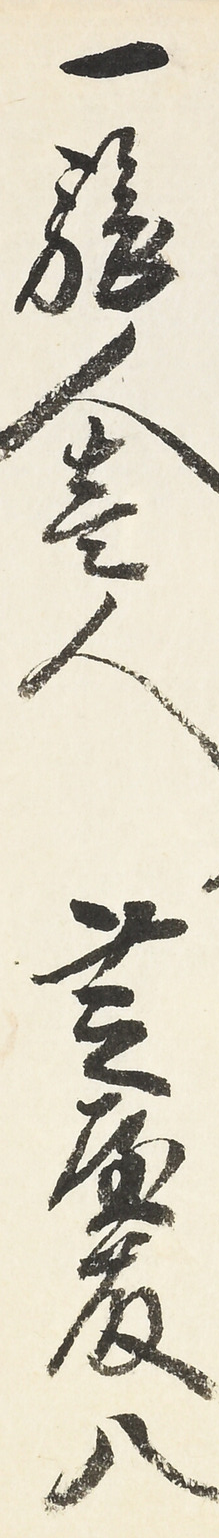一旅人壱人芝屋藤八
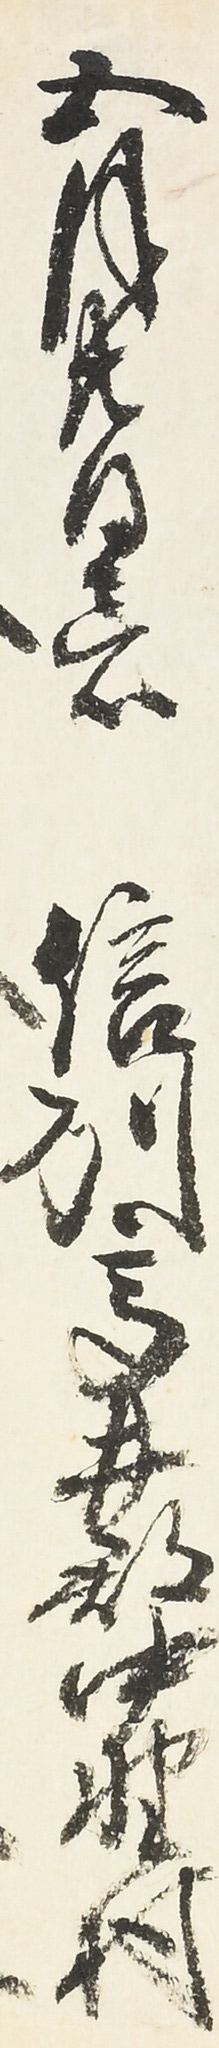五月廿日着信州高井郡中野村
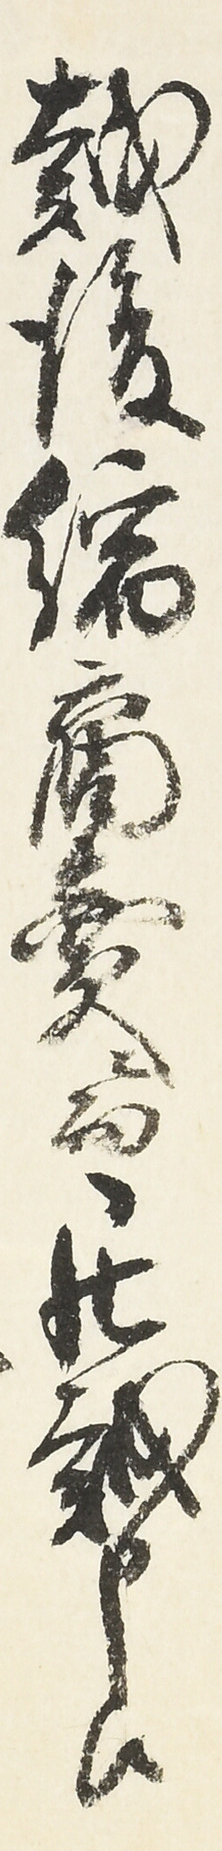越後縮商売ニ而罷越申候
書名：町中旅人泊控帳
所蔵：伊那市立高遠町図書館・合同会社AMANE
